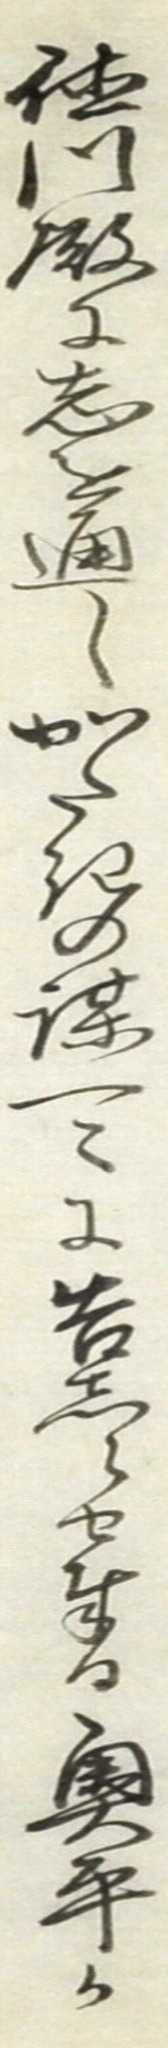徳川殿に志を通しかたきの謀一々に告しらせ奉る奥平か
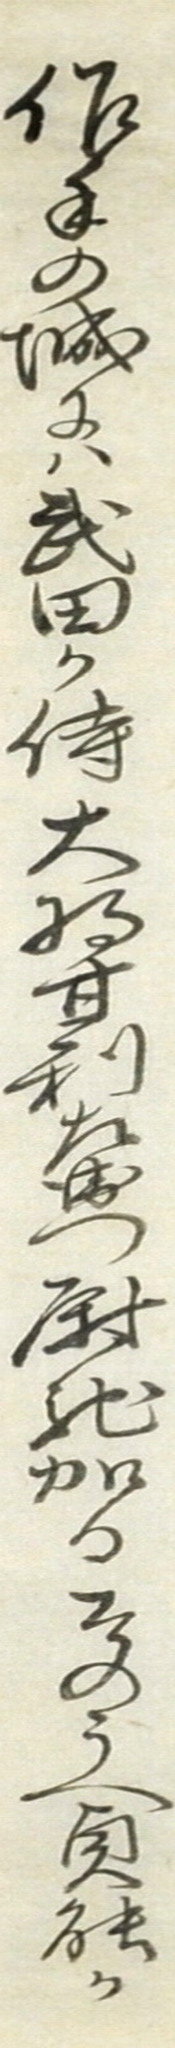作手の城には武田か侍大将甘利左衛門尉馳加るそのうへ貞能か
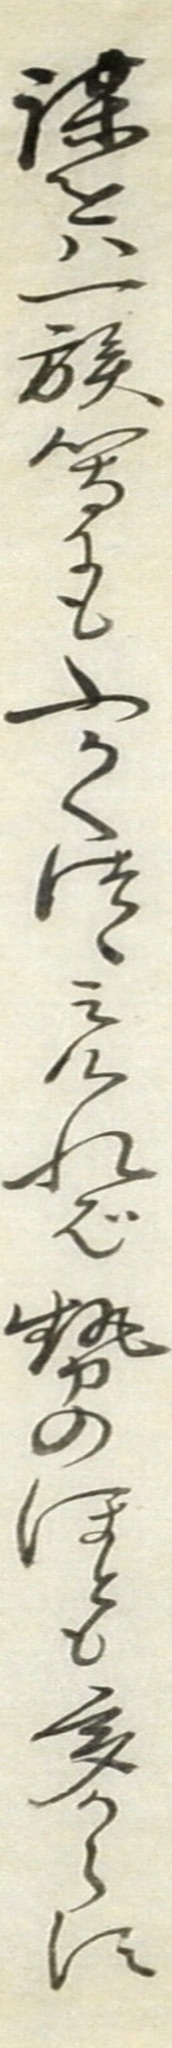謀をは一族等にもふかくつゝみければ勢のほとも多からす
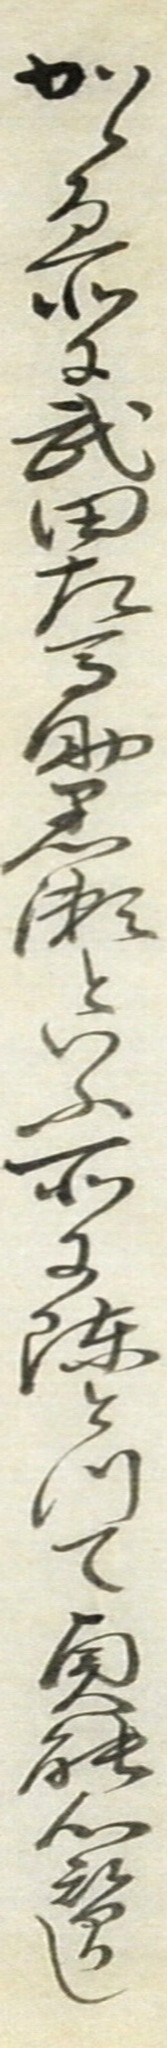かゝる所に武田左馬助黒瀬といふ所に陣とつて貞能心替りし
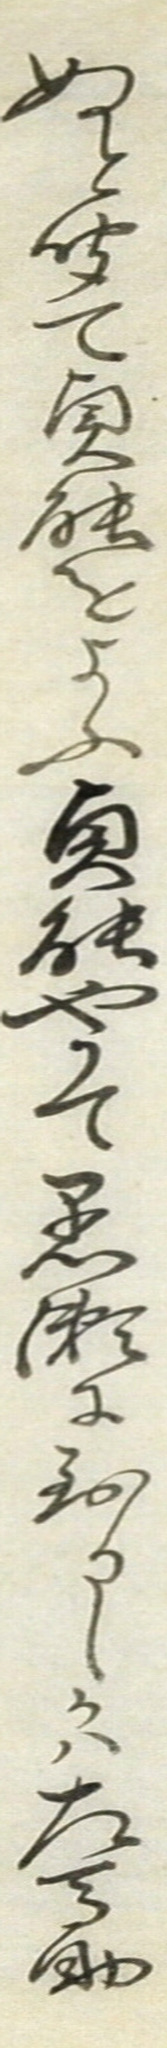ぬと聞て貞能をよふ貞能やかて黒瀬に到りしかは左馬助
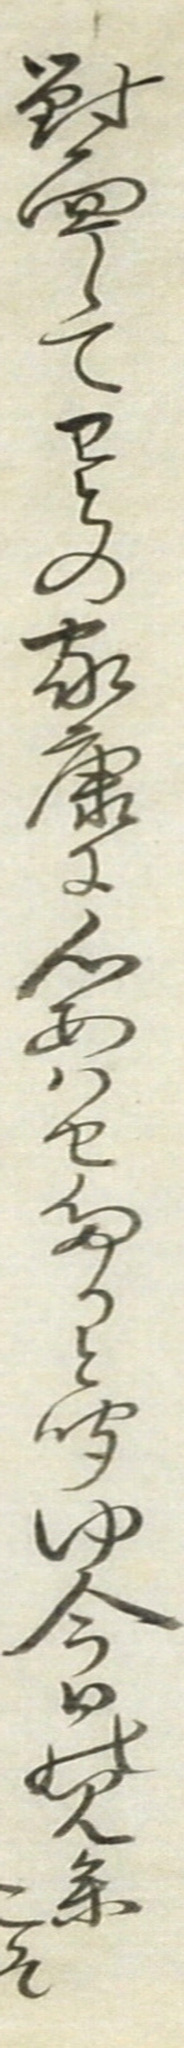対面してせとの家康に心あはせたりと聞ゆ今日の見参こそ
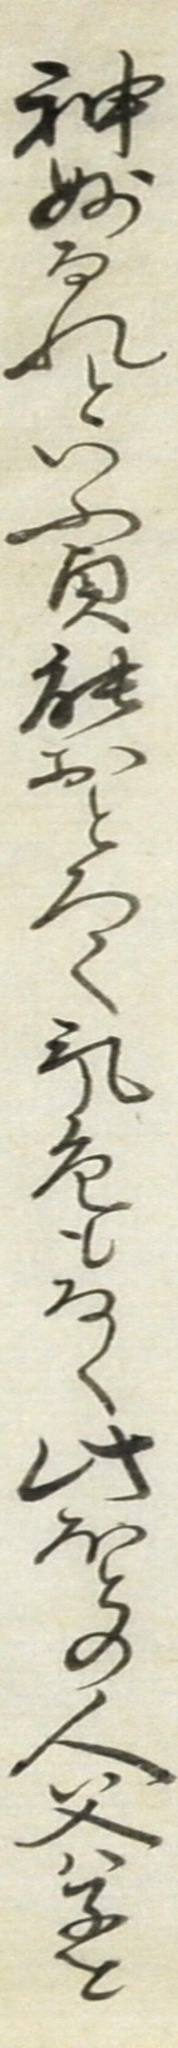神妙なれといふ貞能おとろく気色もなく此ほとの人父は子を
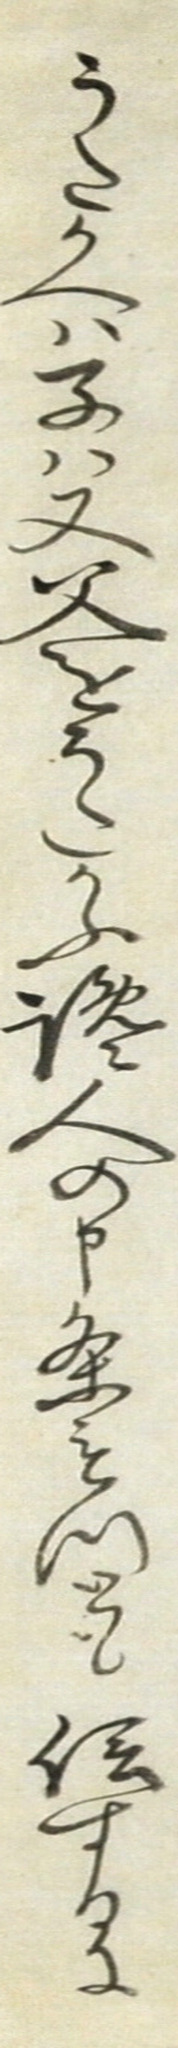うたかへは子は父をうたかふ讒人の申条もつとも信するに
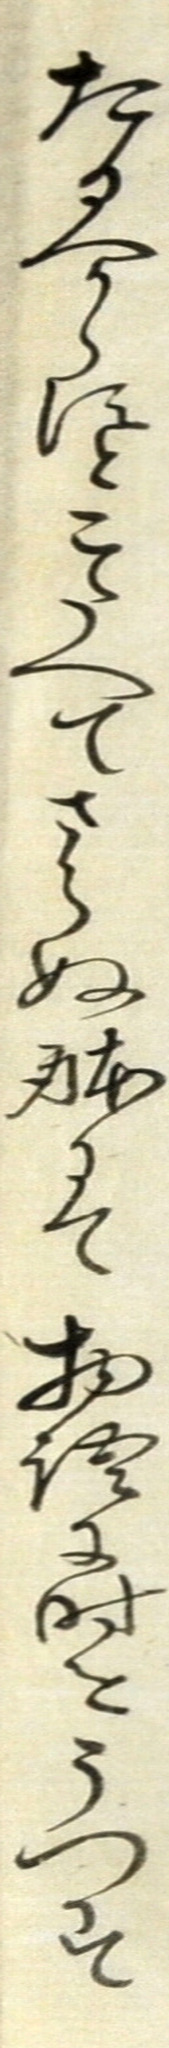たるへからすとこたへてさらぬ体にて物語に時をうつす

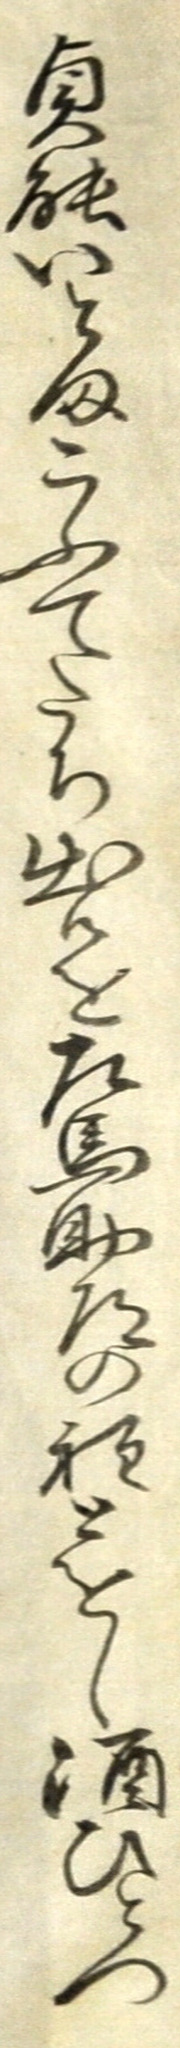貞能いとまこふてたち出候を左馬助道の程とをし酒ひとつ
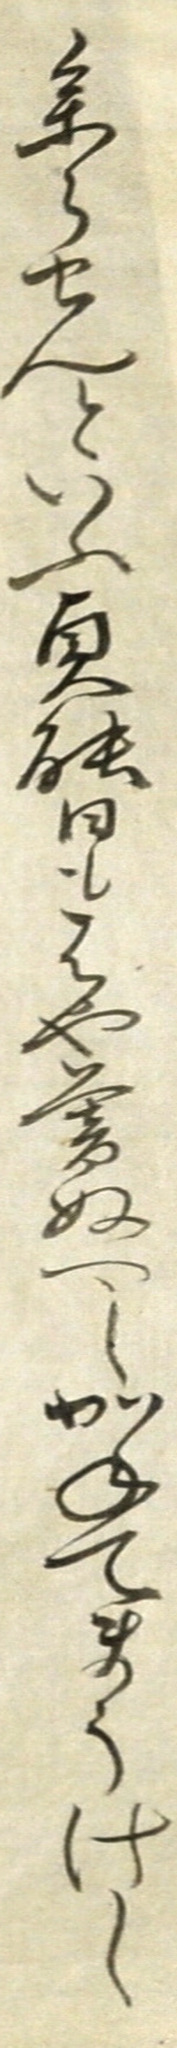参らせんといふ貞能日もはや暮ぬへしかねてまうけし
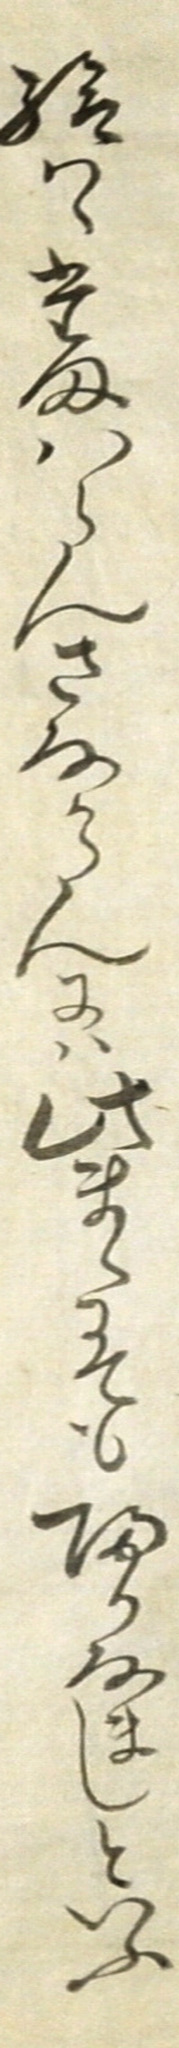給はゝたまはらんさなからんには此まゝにても帰りなましといふ
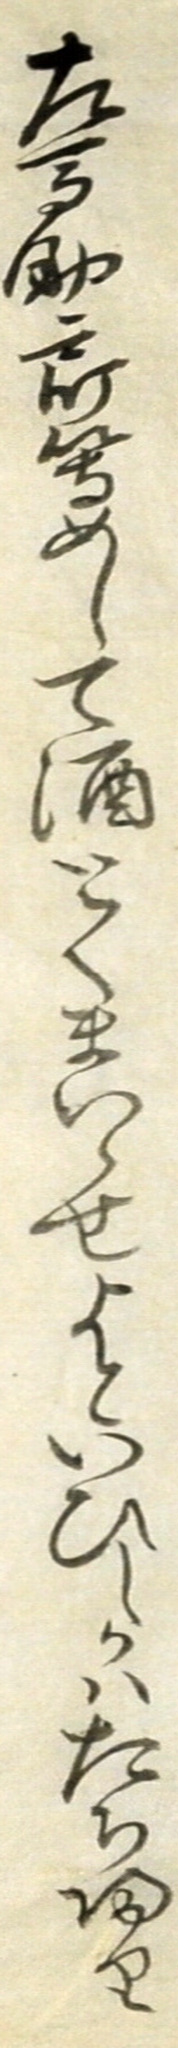左馬助郎等めして酒とくまいらせよといひしかはたち帰り
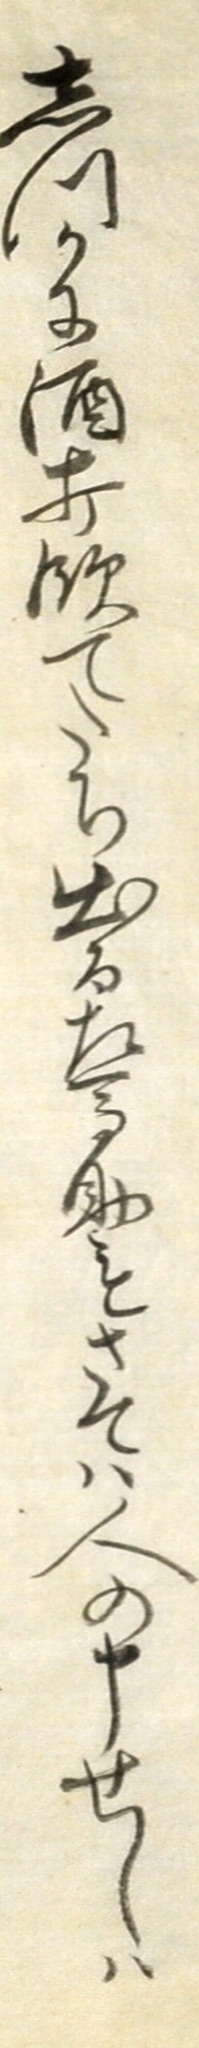しつかに酒打飲てたち出る左馬助もさては人の申せしは
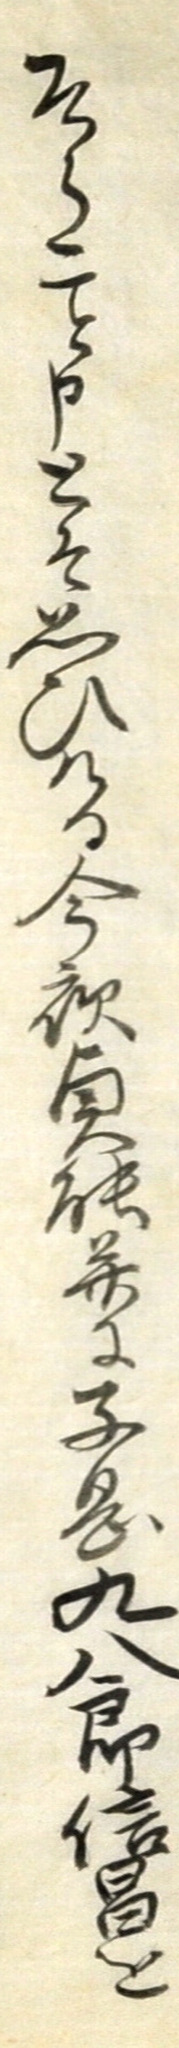そらこと申とそ思ひける今夜貞能幷に子息九八郎信昌を
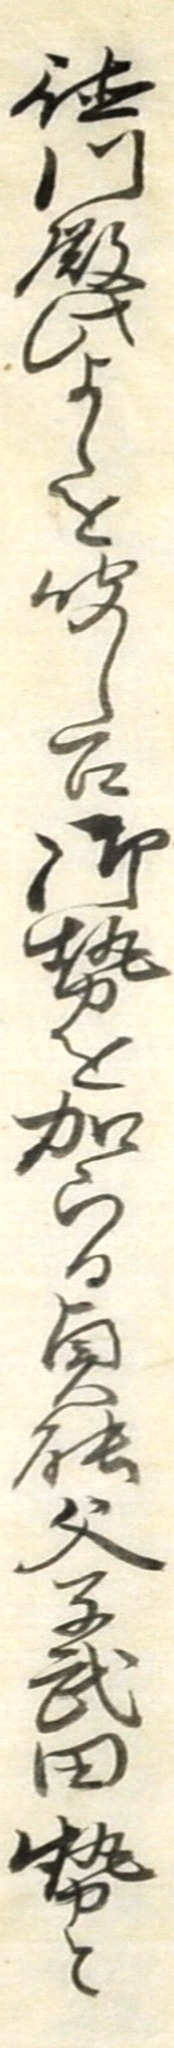徳川殿此よしを聞し召御勢を加らる貞能父子武田勢と
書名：藩翰譜（六）
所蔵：伊那市立高遠町図書館・合同会社AMANE
